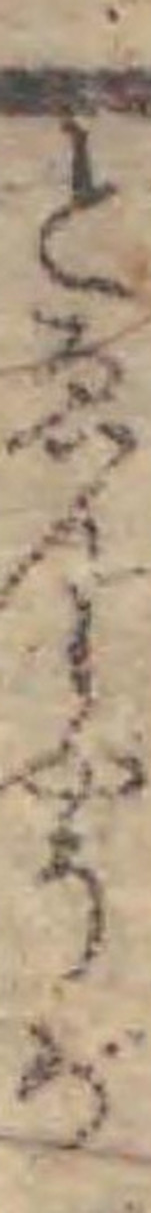とゑんしやうが
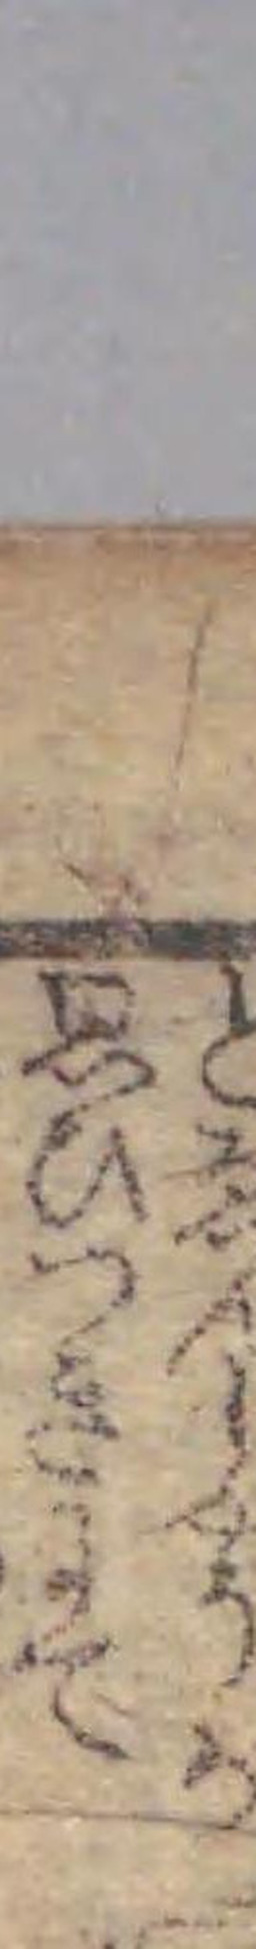思ひつきにて
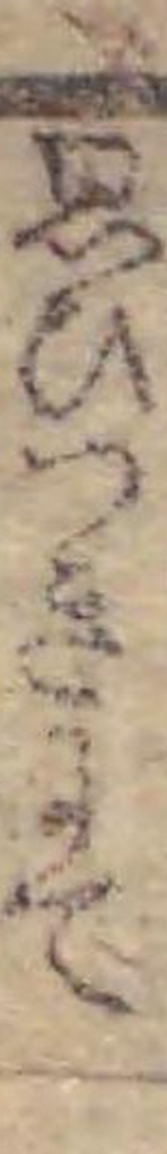思ひつきにて
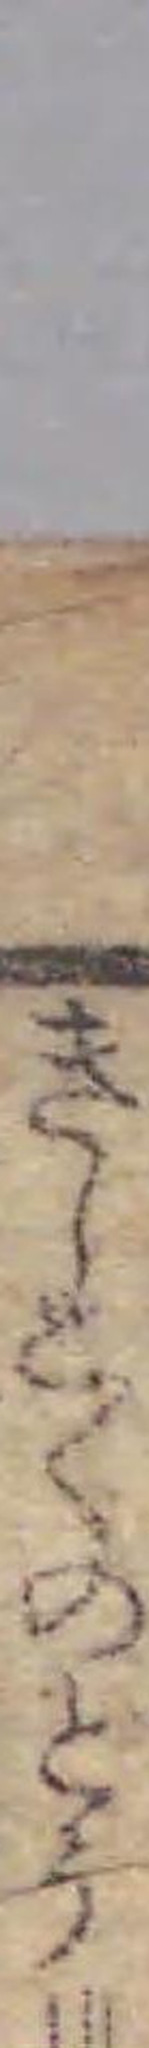きしとくのとう
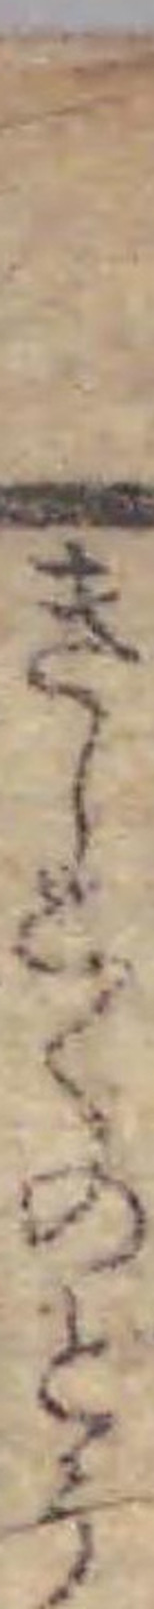きしとくのとう
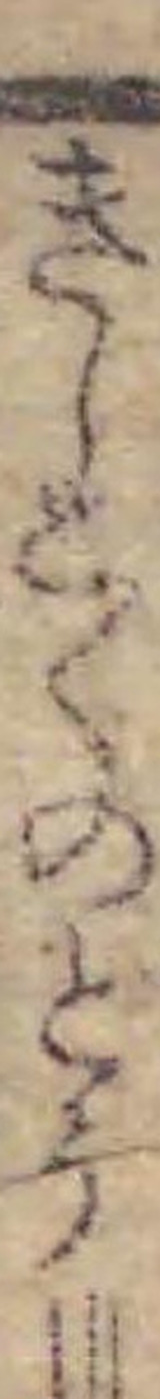きしとくのとう
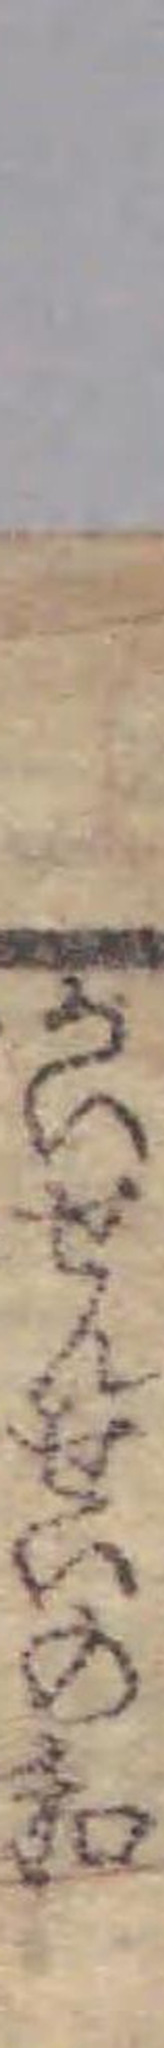かいせんせいの和
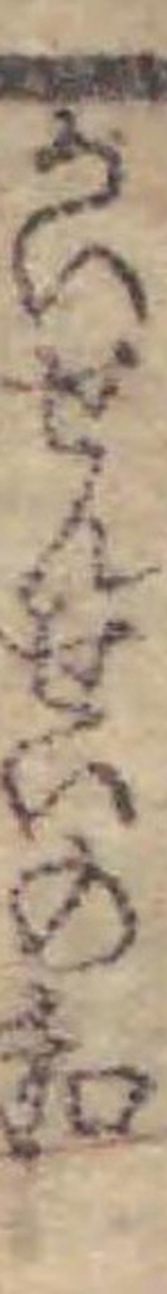かいせんせいの和
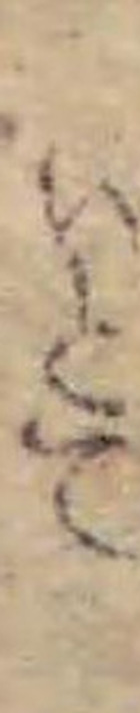いとて
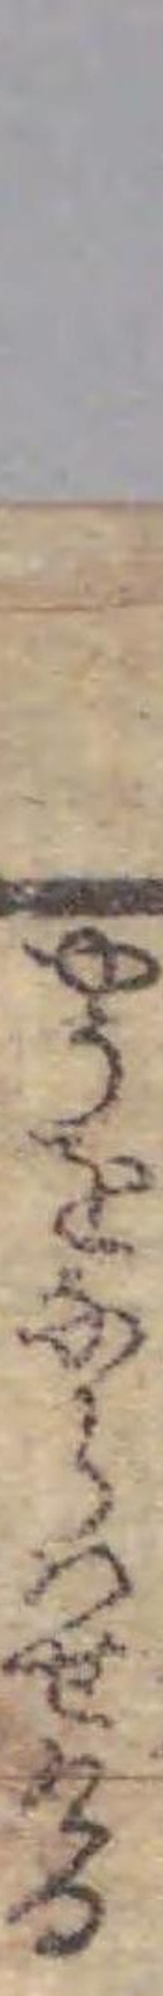やうをならはせける
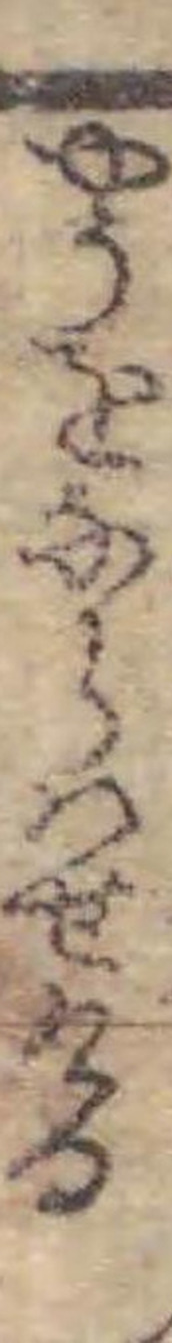やうをならはせける
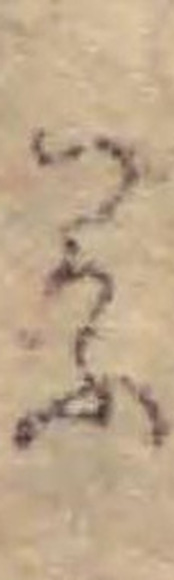つかふ
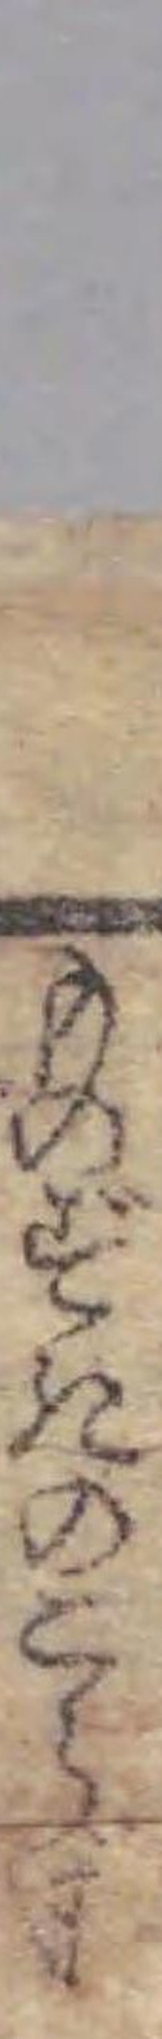ものずきのこらず
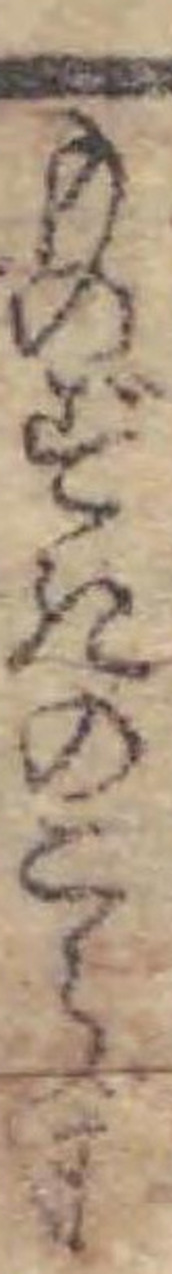ものずきのこらず
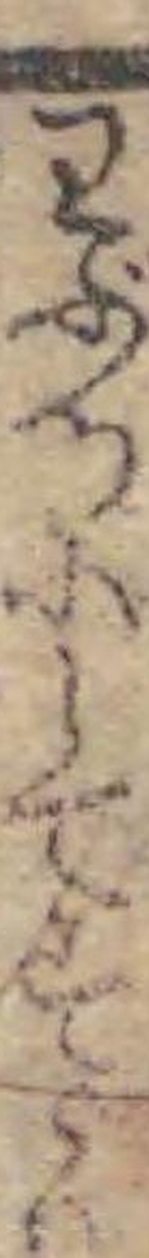わぶつにしてすゞり
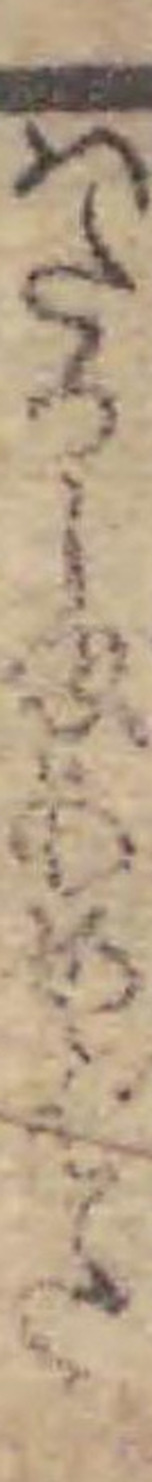はたかしまあめばた
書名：此奴和日本 : 2巻
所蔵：国立国会図書館 National Diet Library, JAPAN
